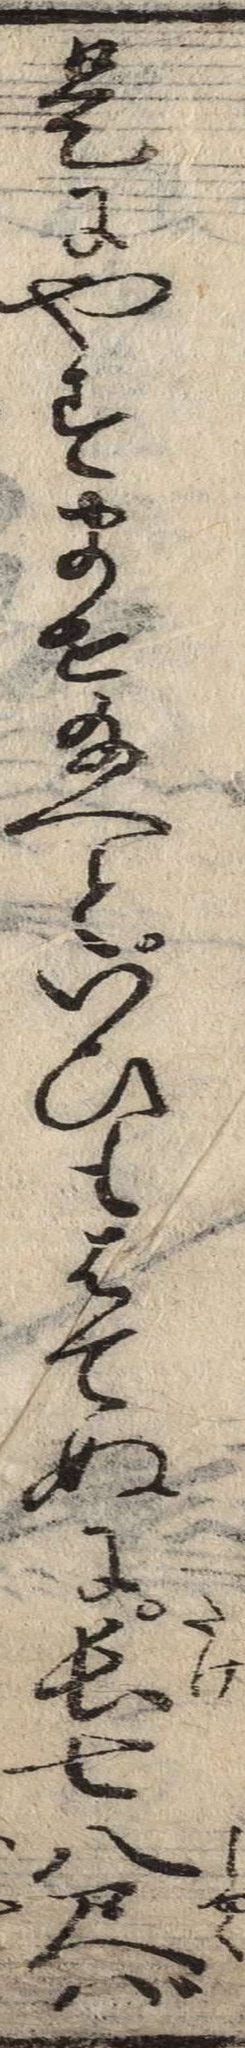是にやすませ給へと。いひもはてぬに。長七八尺ば
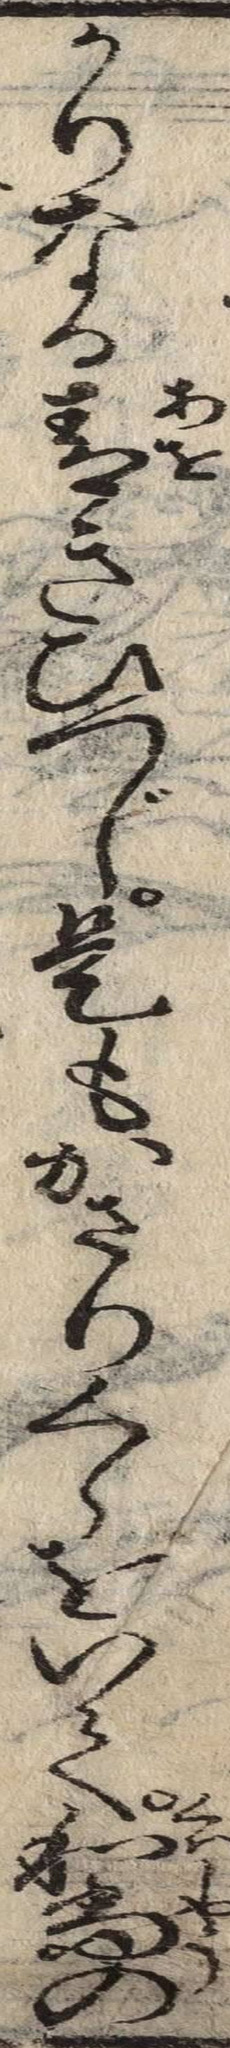かりなる青きひつじ。是もかさりくらをいて。和尚の
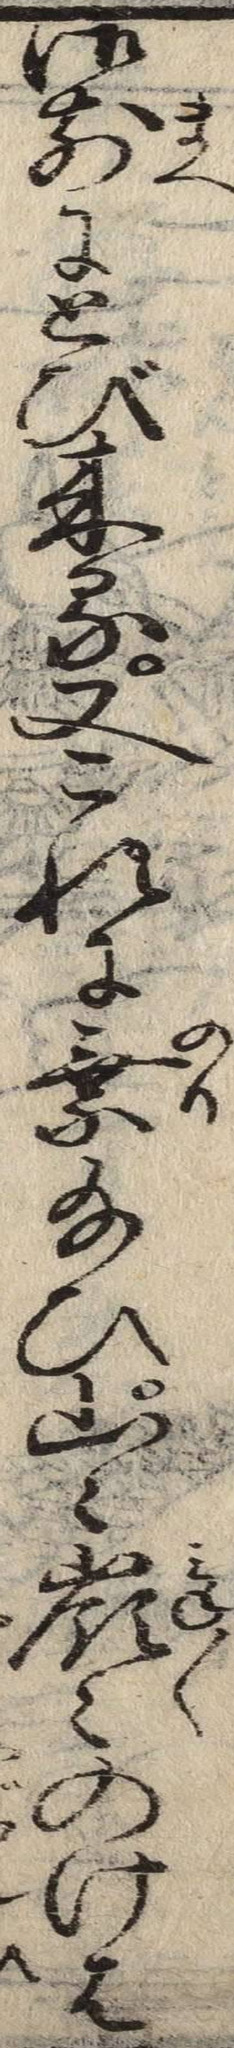御前にとび来る。又これに乗給ひ。山々嶺々のけは
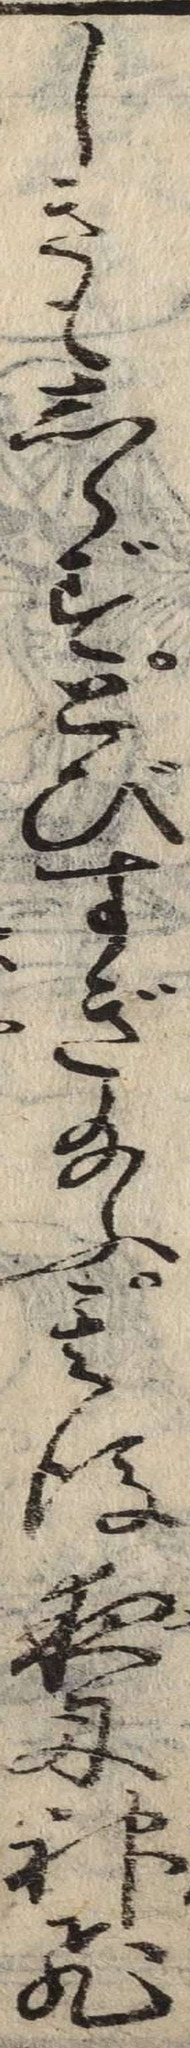しきもしらず。とびすぎ給ふ。其後夜叉神飛
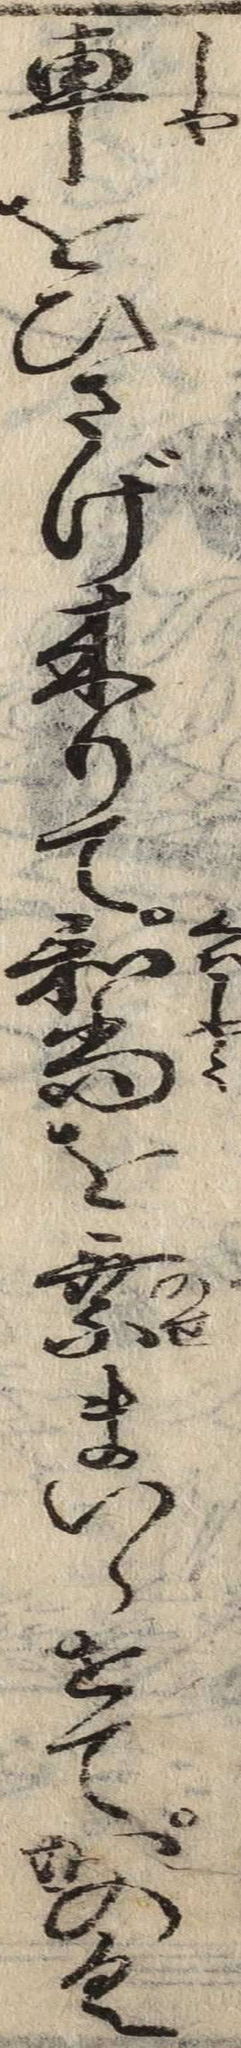車をひさげ来りて。和尚を乗まいらせて。かのく
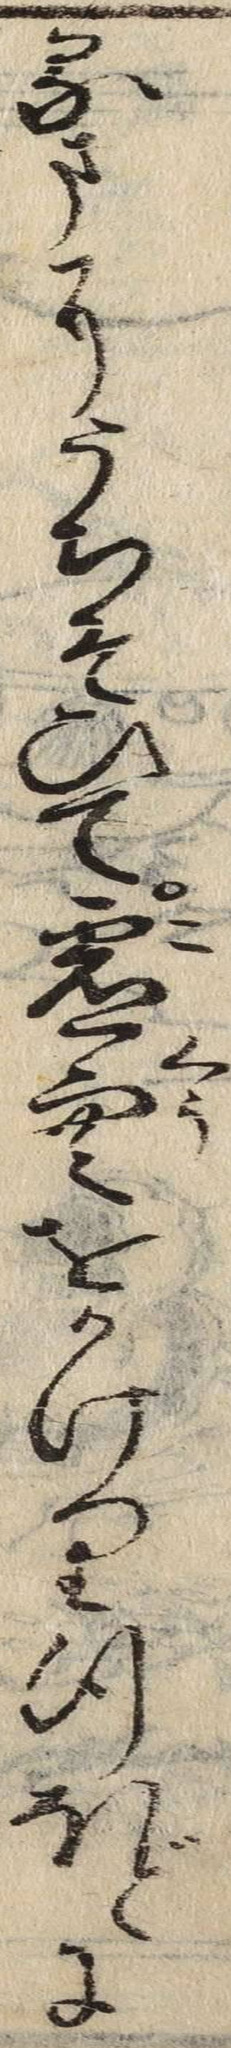るまにうちそひて。虚空をかけり行ほどに
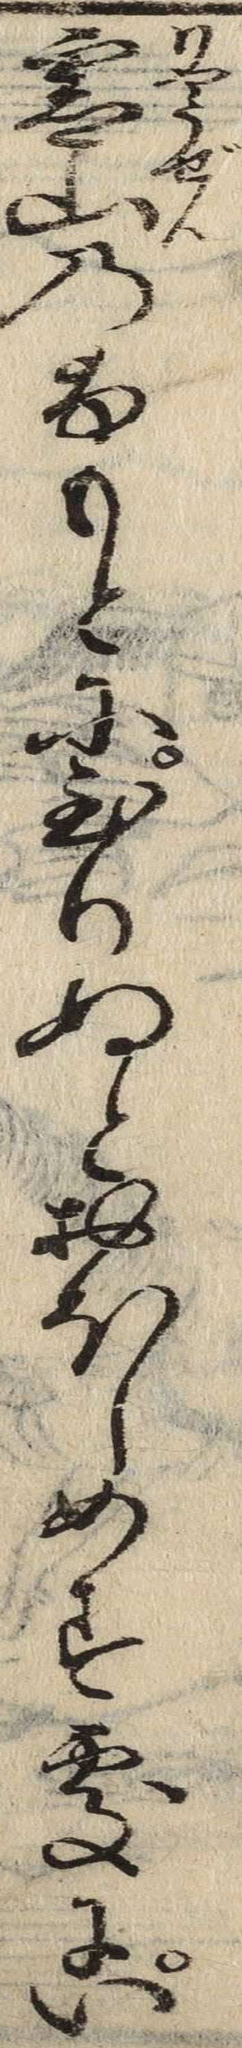霊山のふもとに。至りぬとおほしめす処に。い
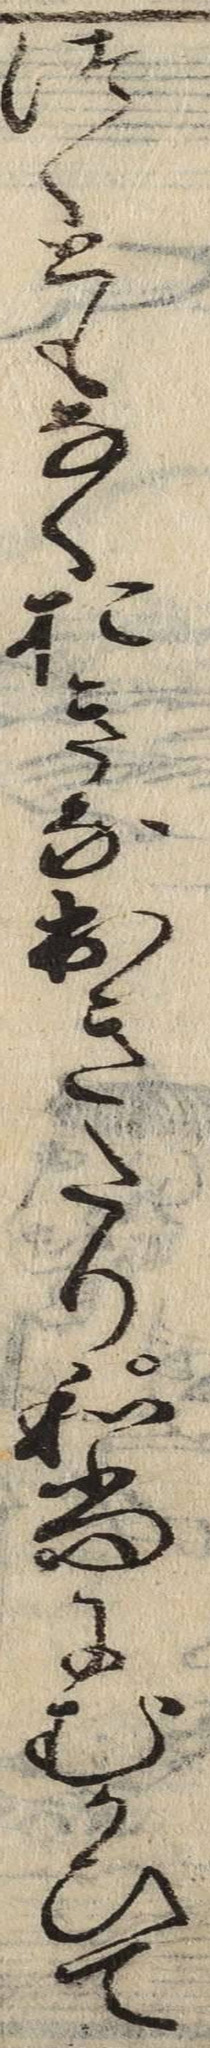つくともなくおきな出きたり。和尚にむかひて
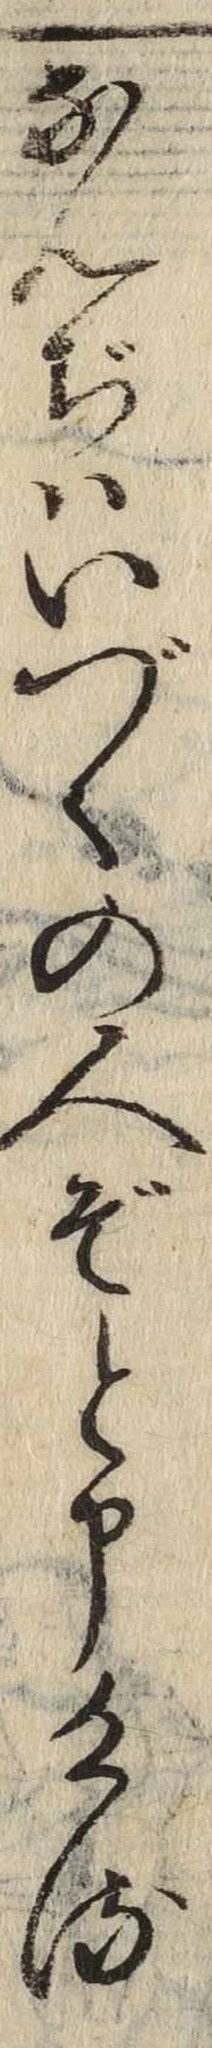なんぢはいづくの人ぞと申ける

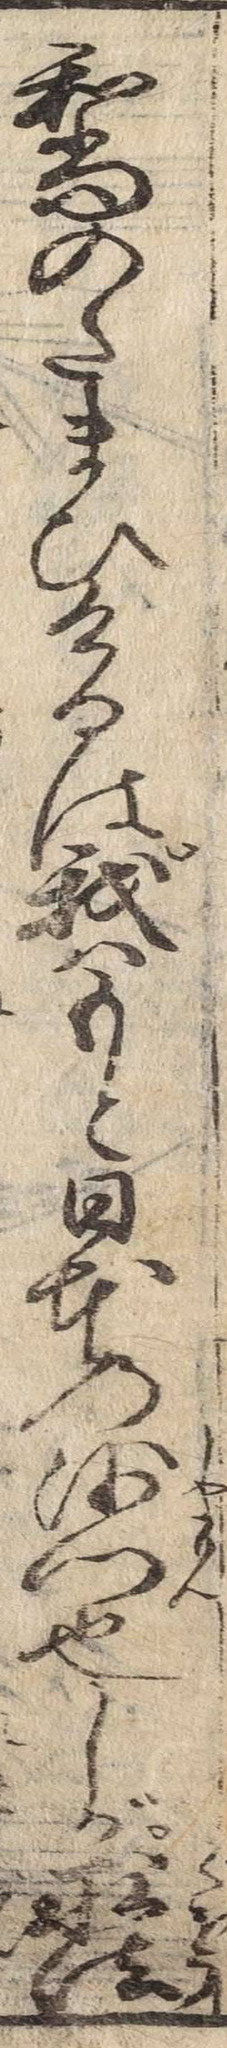和尚のたまひけるは。我はもと日本の沙門也しが。求法
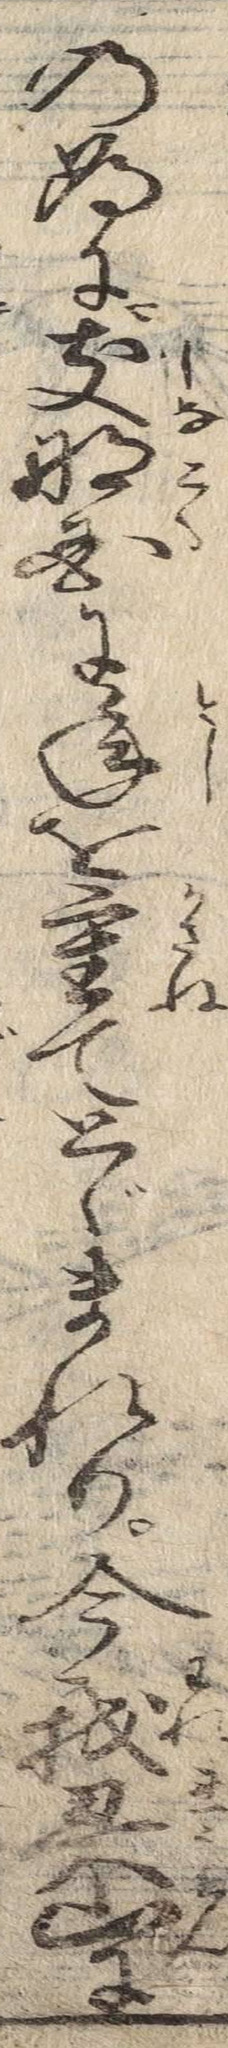の為に。支那国に年を重てとゞまれり。今我霊山に
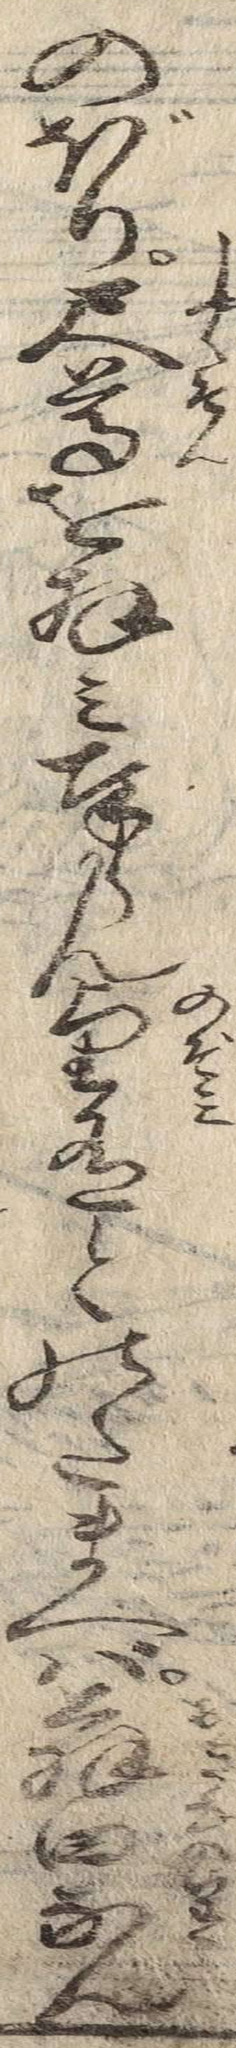のぼり。尺尊を拝み奉らん望有とのたまへば。翁曰なん
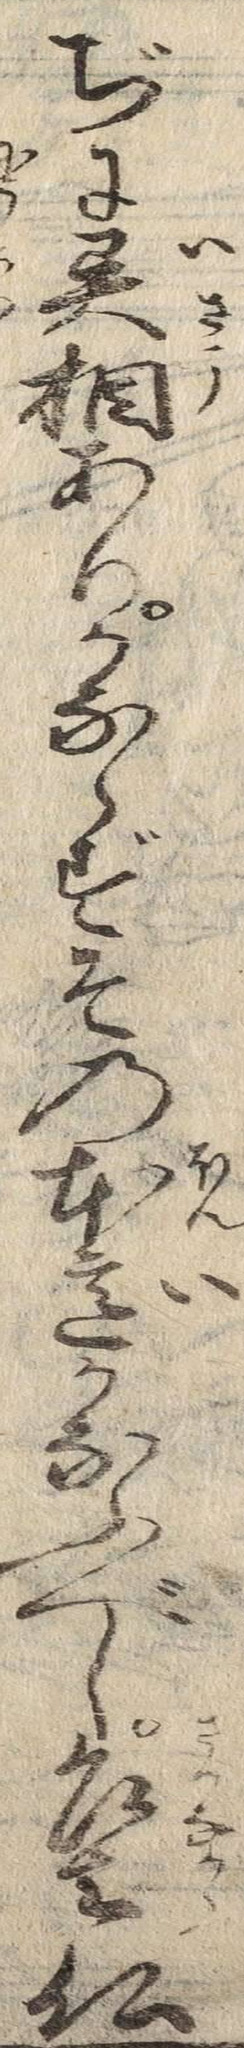ぢに異相あり。かならずその本意かなふべし。然乍仏
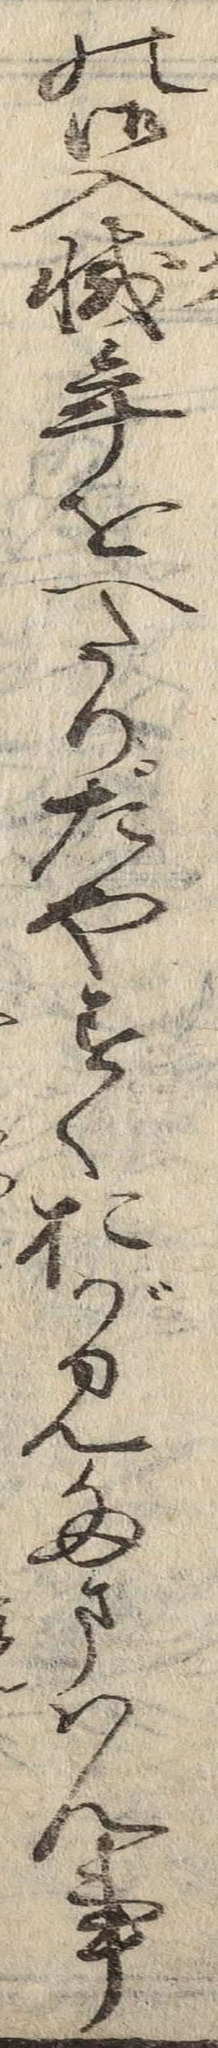の御入滅年をへたり。たやすくおがみたまはん事
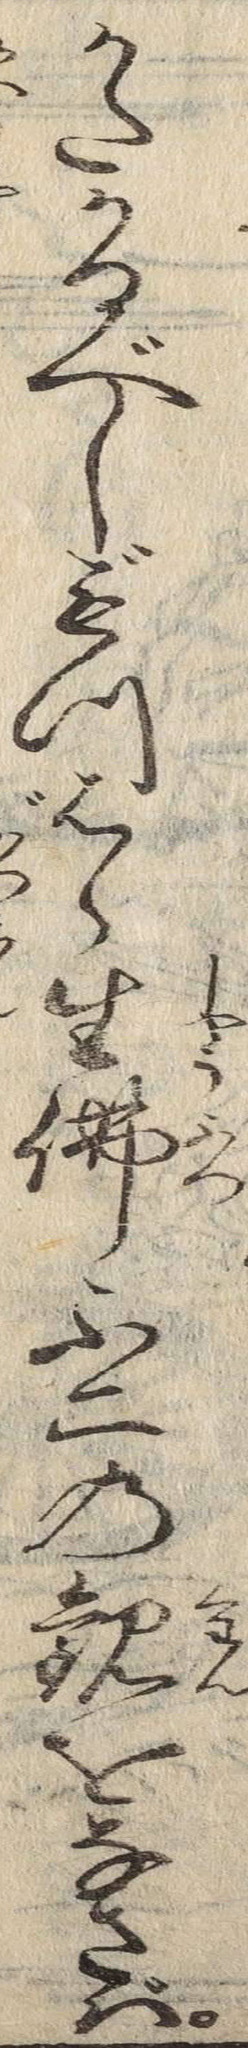かたかるべし。もつはら生仏不二の観をなさば。
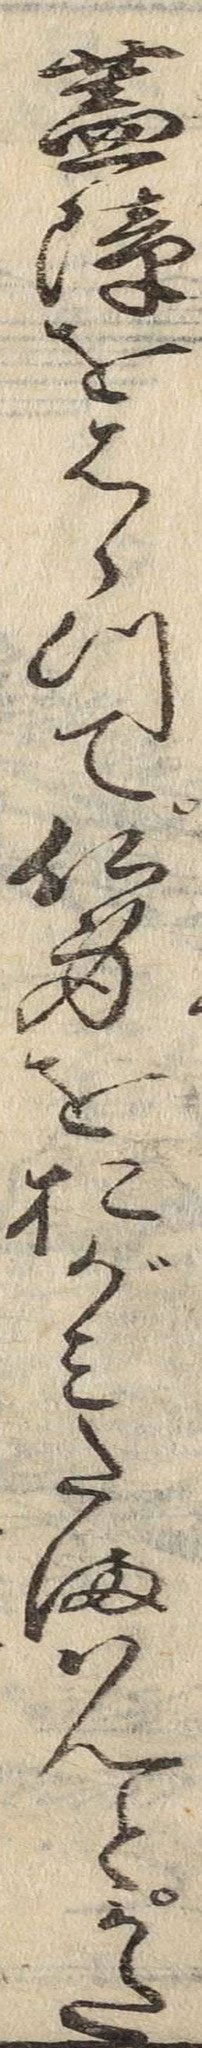蓋障をはらつて。仏身をおがみたまはんと。かた
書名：弘法大師御傳記
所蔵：京都府立京都学・歴彩館 国文学研究資料館
